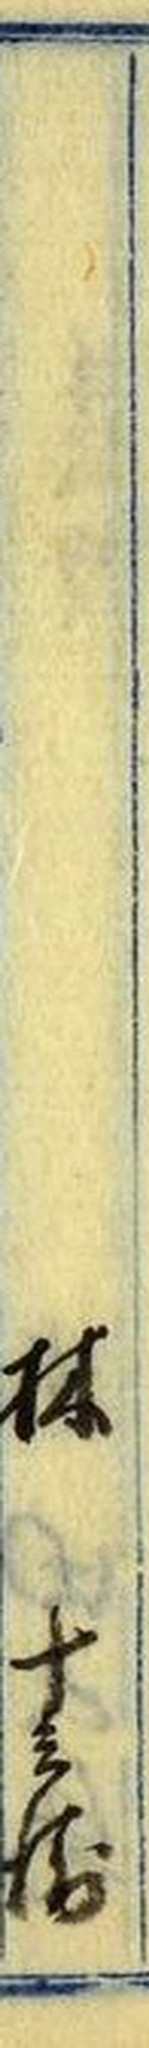林十兵衛
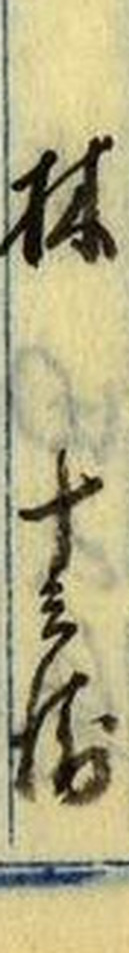林十兵衛
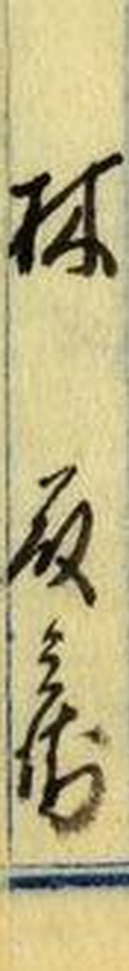林藤兵衛
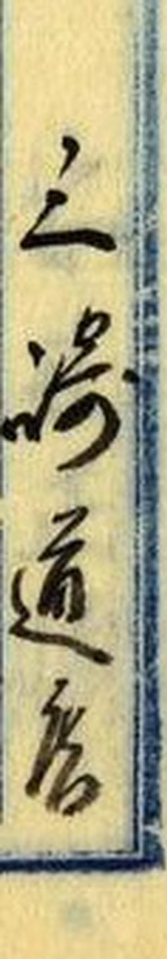三崎道庵
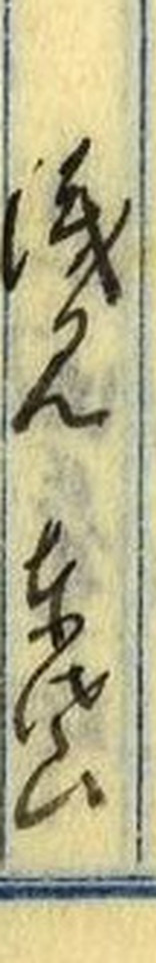浅見東岱
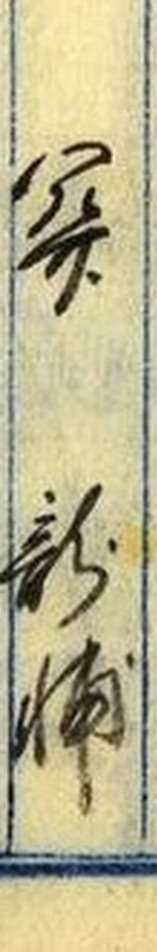関龍輔

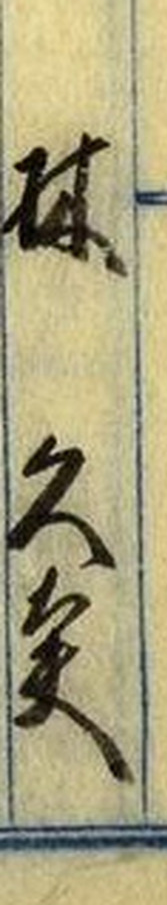林九太夫
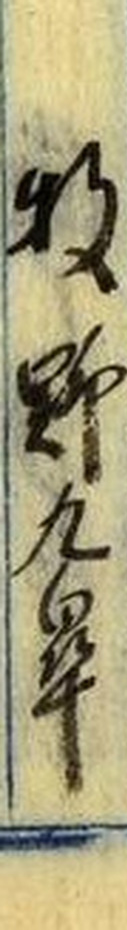牧野久皐
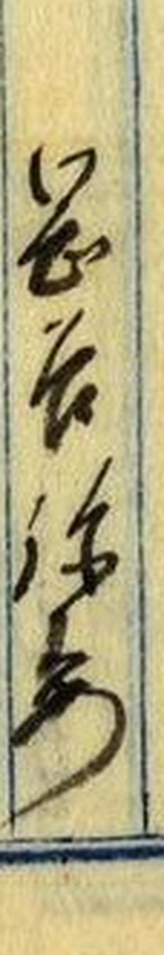岡谷弥右衛門
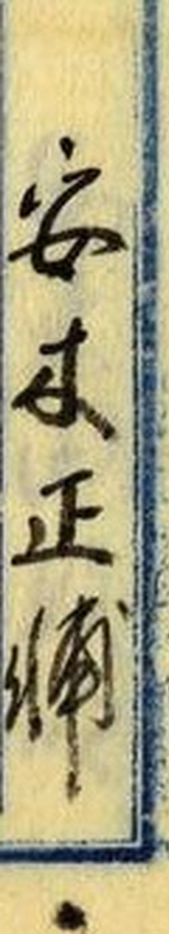安木正輔
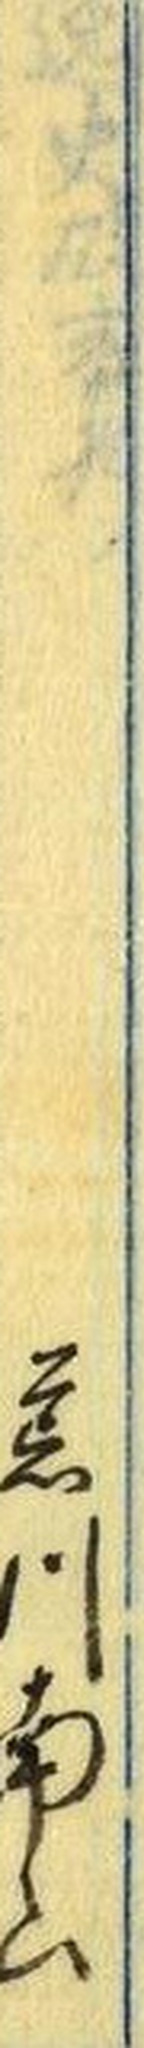荒川南山
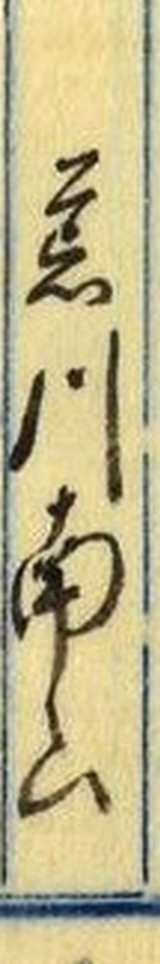荒川南山
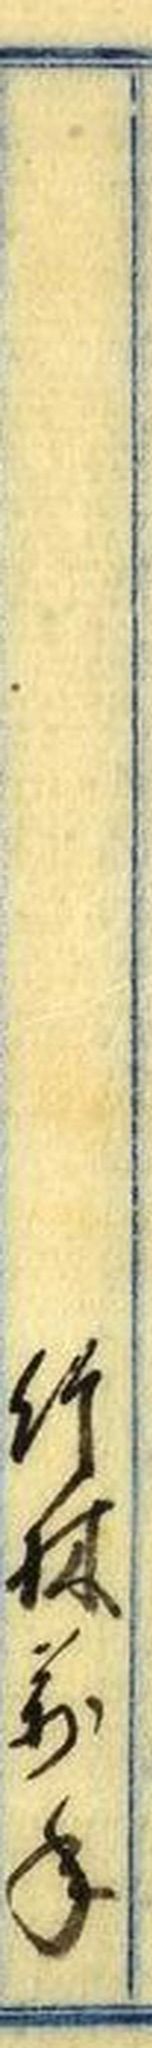竹林万年
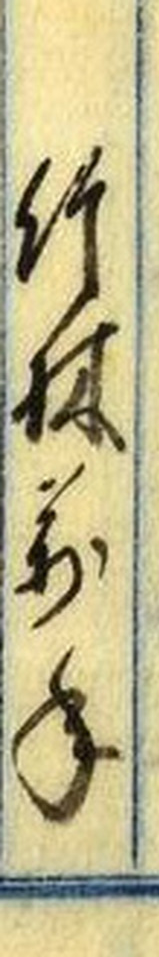竹林万年
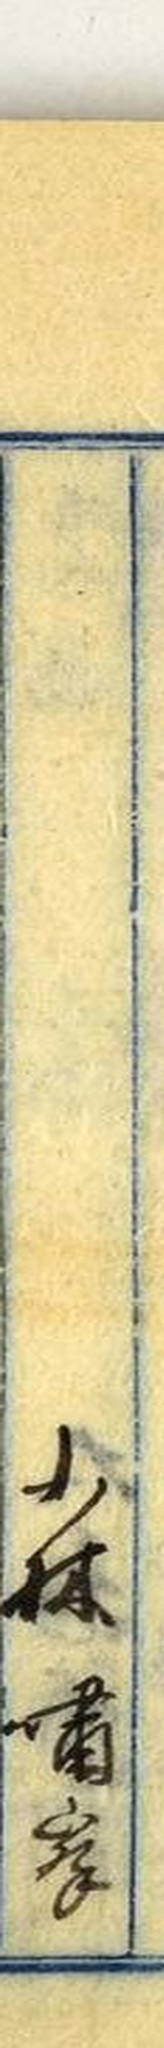小林嘯峯
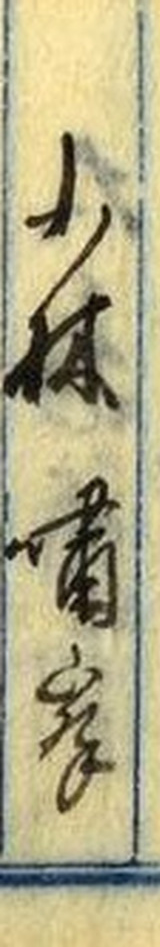小林嘯峯
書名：温古集 四巻
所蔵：福井県文書館 Fukui Prefectural Archives
